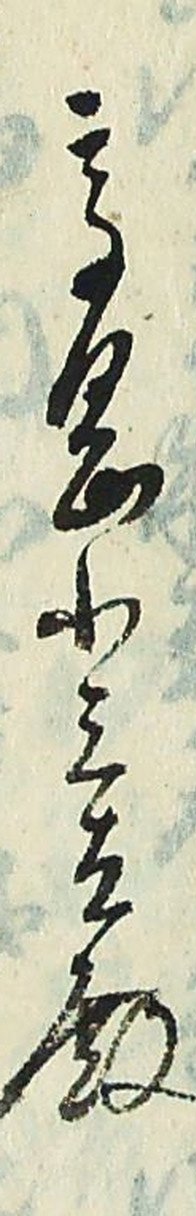高岡小三太殿
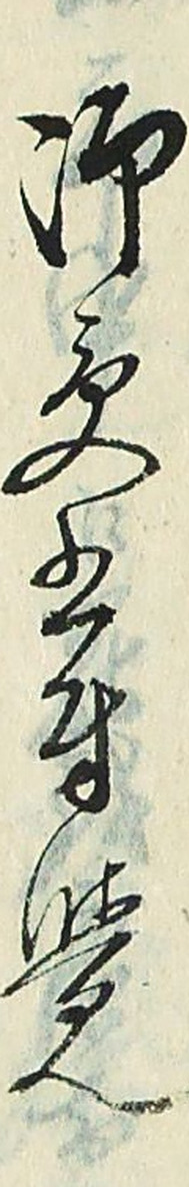御受書付覚
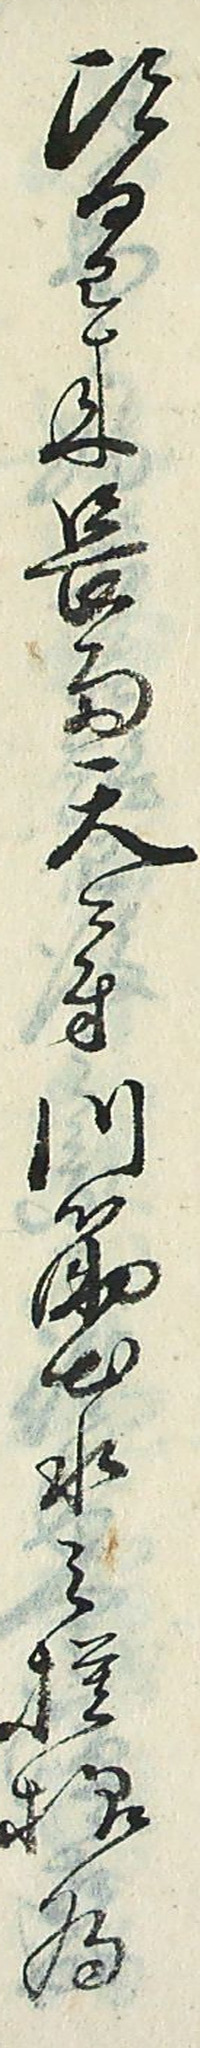頃日已来長雨天に付川筋出水之模様為
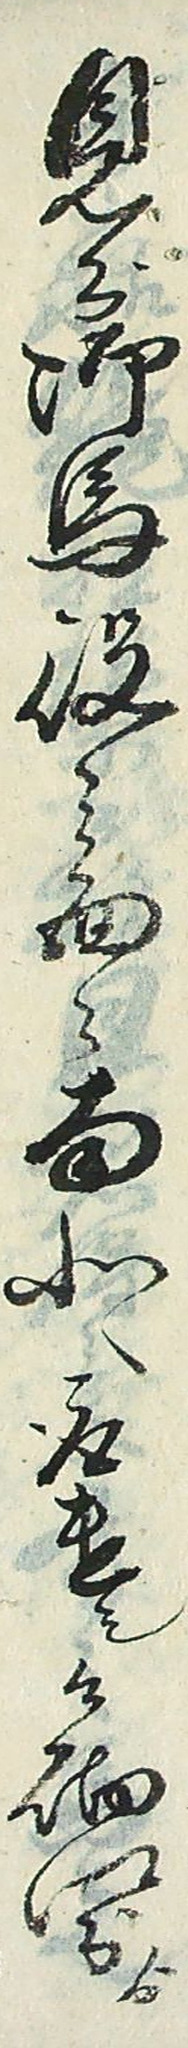見分御馬役之面々南北へ取遣し候砌郷分ゟ
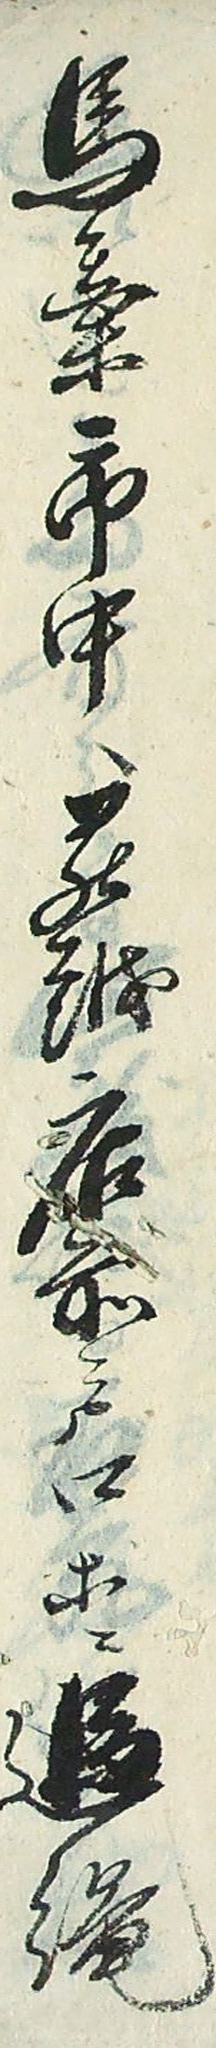馬乗市中へ罷越店前戸口等に追縄

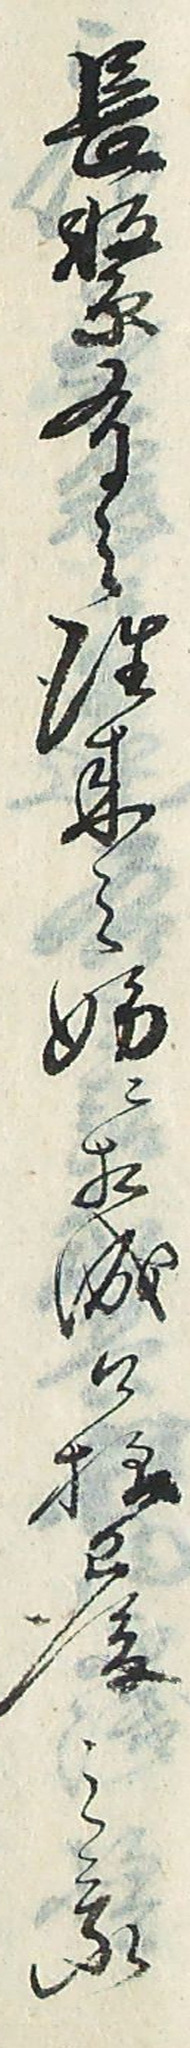長繋有之往来之妨に相成候様已後之義
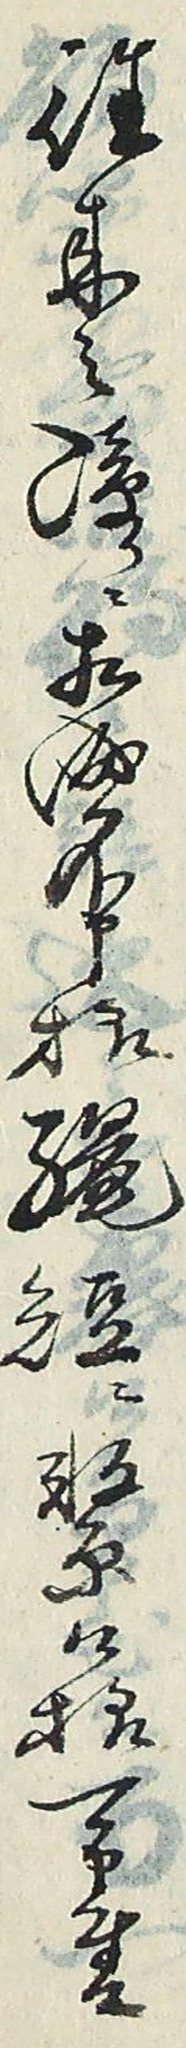往来之障りに相成不申様縄短に繋候様可申付候
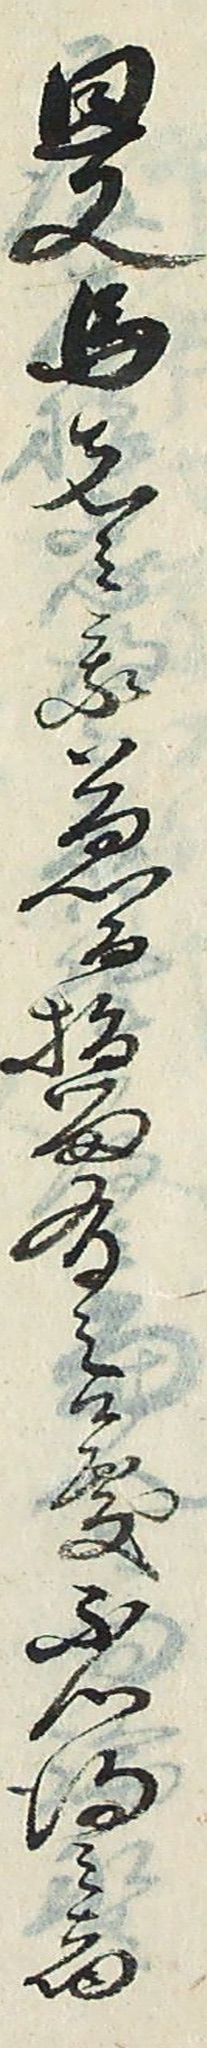且又馬先之義兼而指留有之候處不心得之者
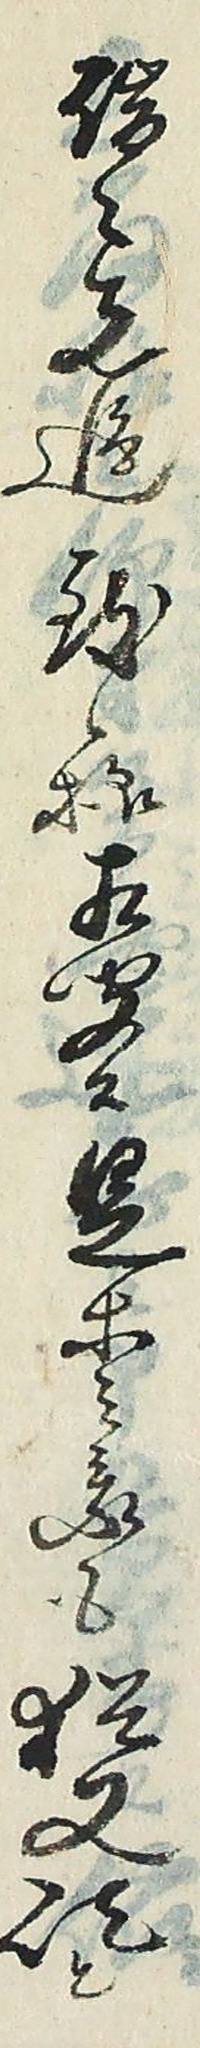端々先追致候様相聞候是等之義も猶又屹と
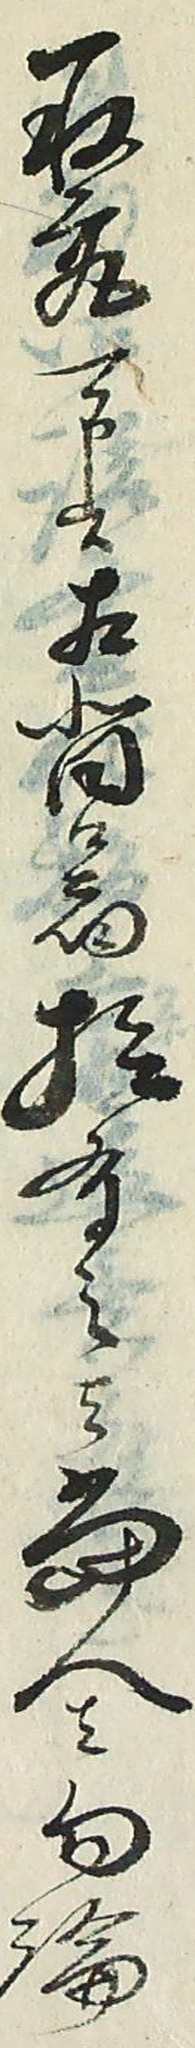取究可申候相背候者於有之者当人者勿論
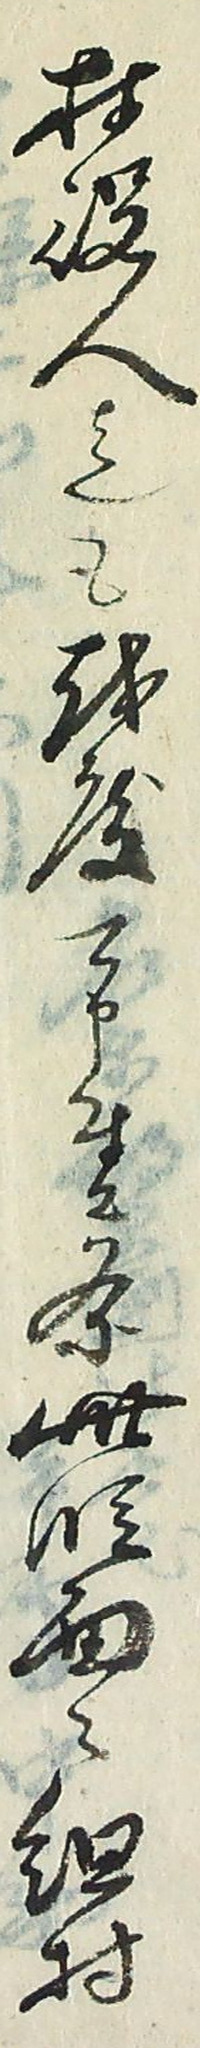村役人迄も越度可申付候条此段面々組村
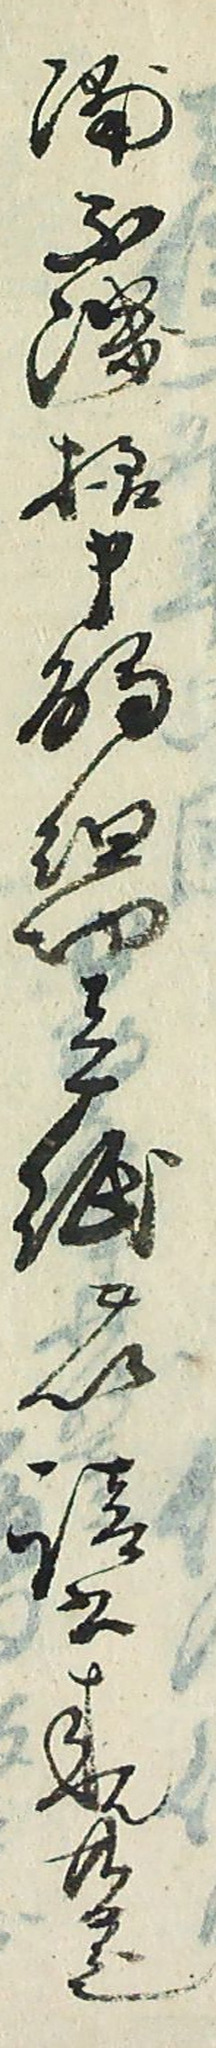浦不洩様申触組切壱紙を以請書来る廿日迄
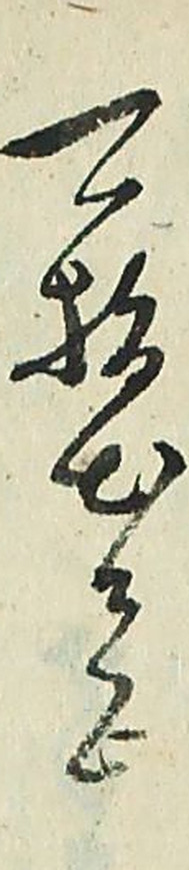可指出候以上
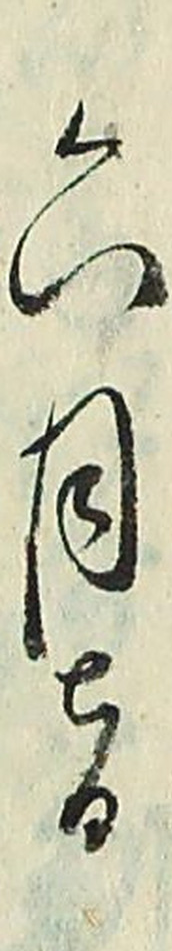六月七日
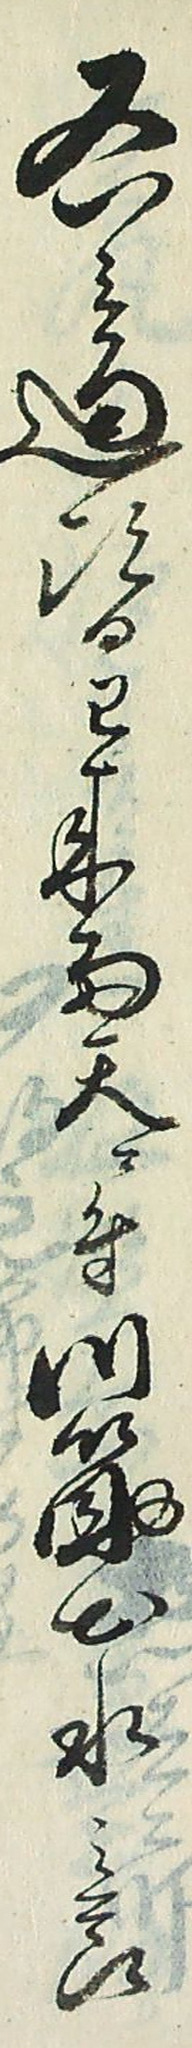右之通頃日已来雨天に付川筋出水之節
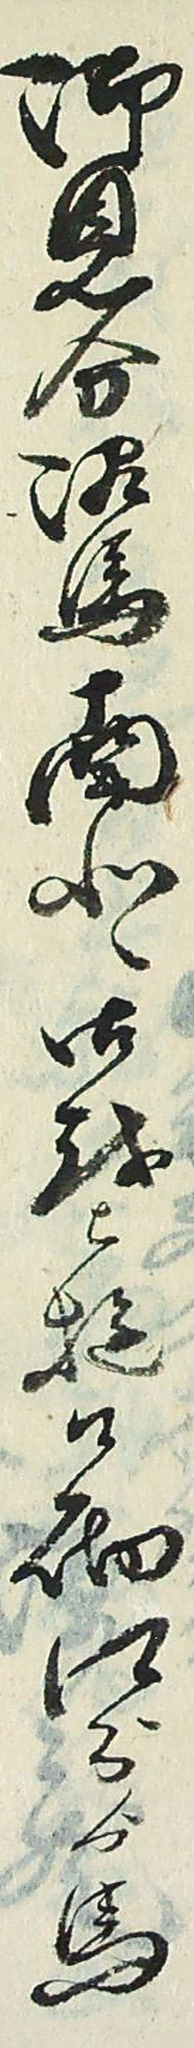御見分御馬南北へ御越被遊候砌郷分ゟ馬
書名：諸御用御□受書控
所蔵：鳴門教育大学 Naruto University of Education
